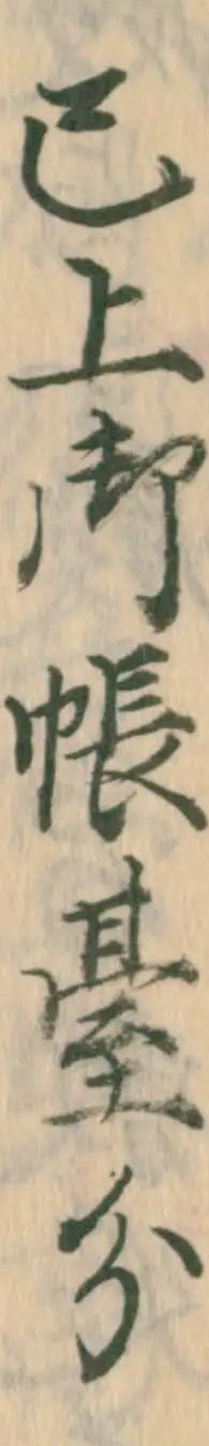巳上御帳台分
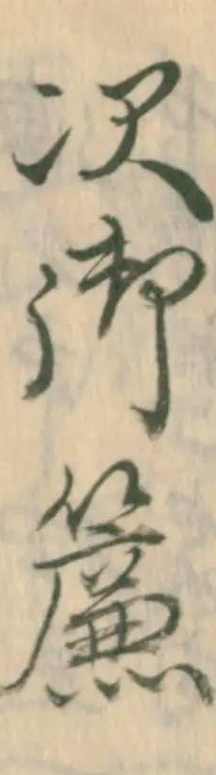次御簾
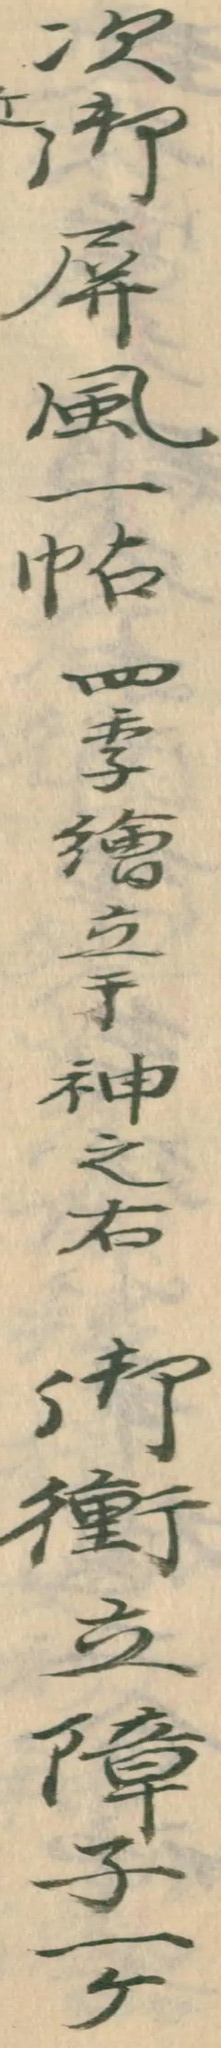次御屏風一帖四季絵立干神之右御衝立障子一ヶ
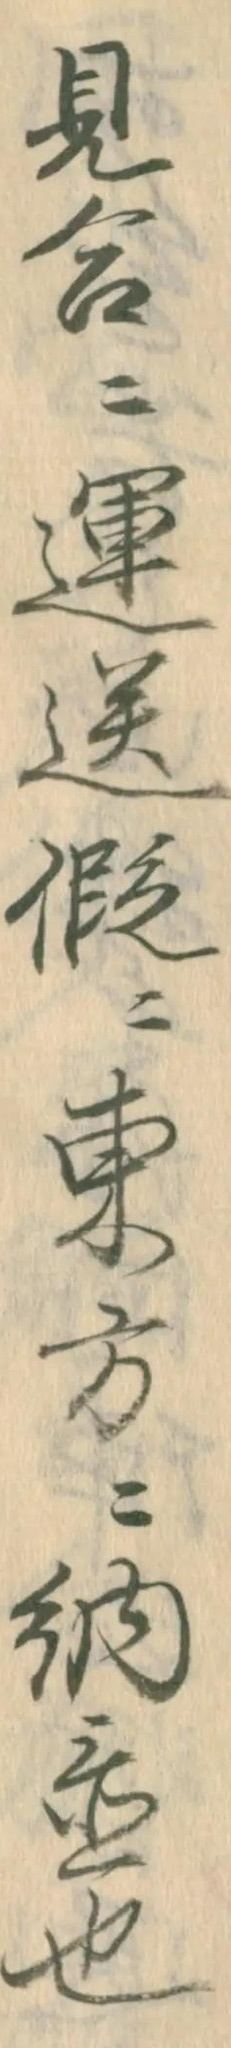見合ニ運送仮ニ東方ニ納置也

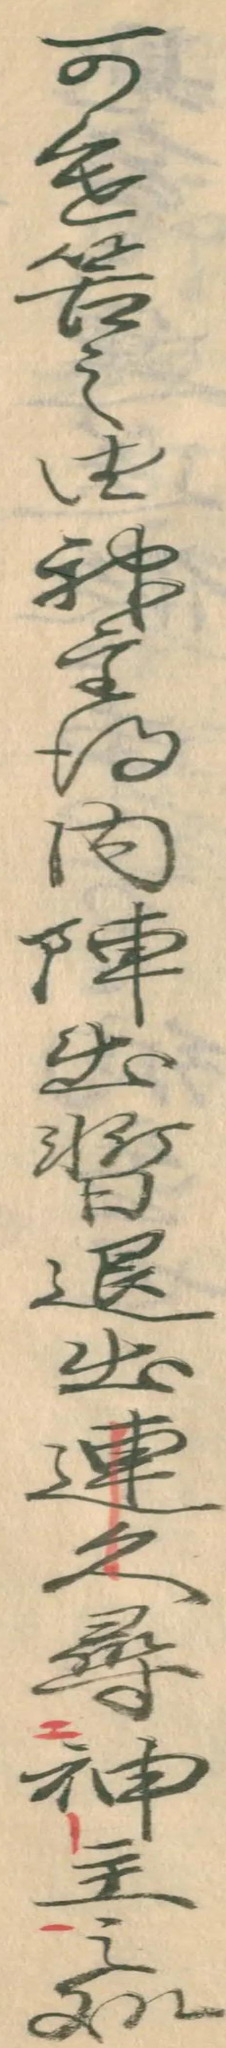可遣筈之由神主得内陣出暫退出連久尋神_主之処
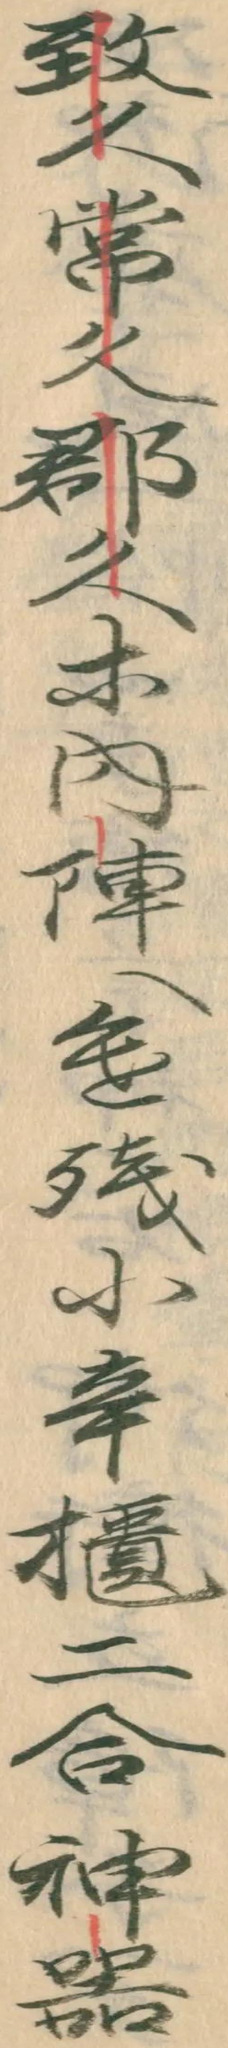致久常久郡久等内-陣へ遣残小辛櫃二合神-器
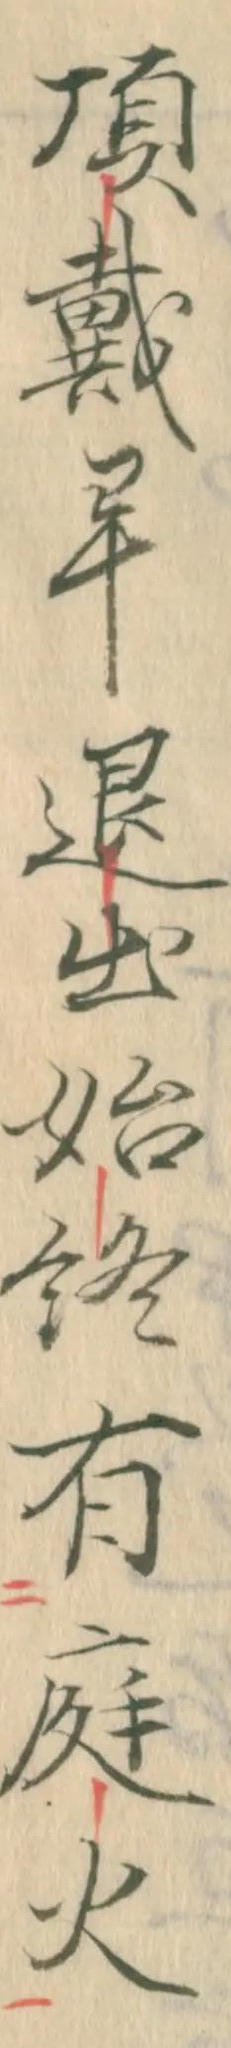頂-戴畢退-出始-終有庭-火
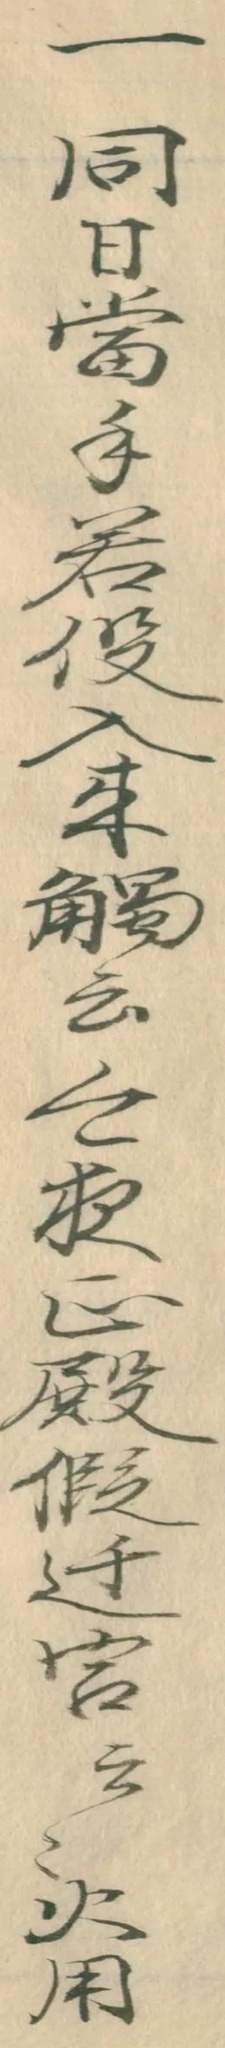一同日当手若役入来触云今夜正殿仮迁宮云々火用
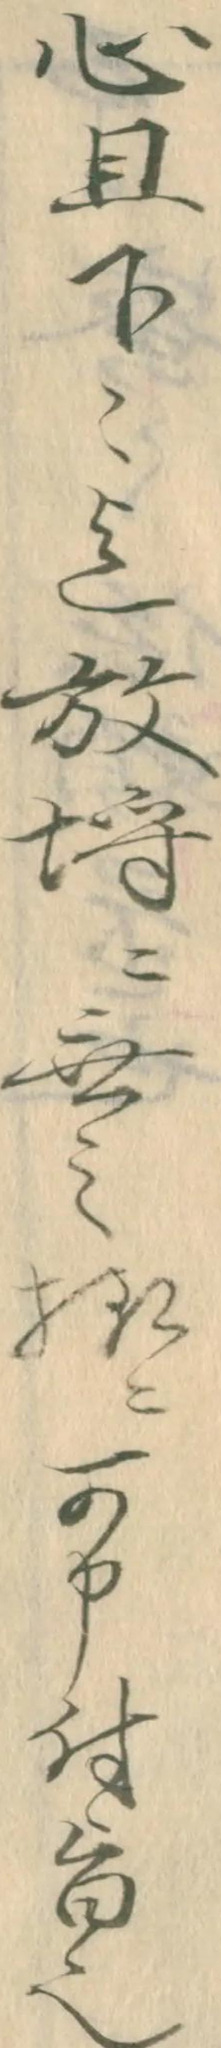心且下々迄放埒ニ無之様ニ可申付旨也
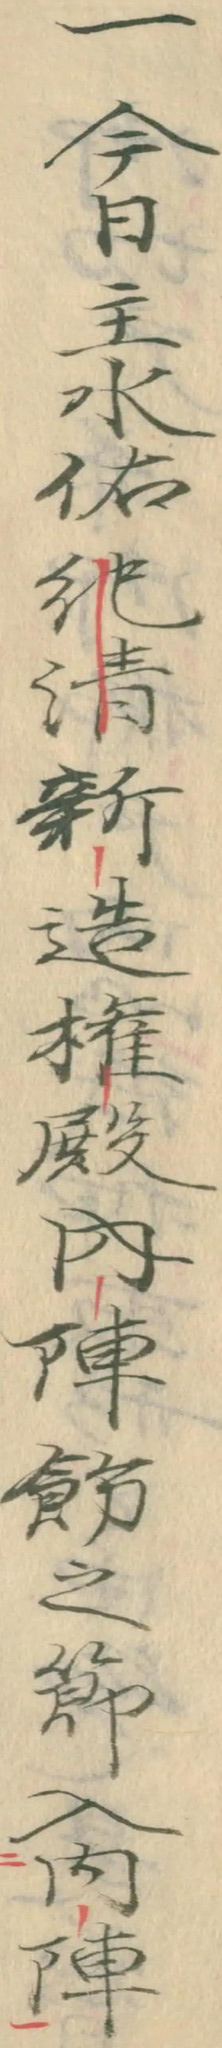一今日主水佑紀清新-造権-殿内-陣錺之節入内-陳

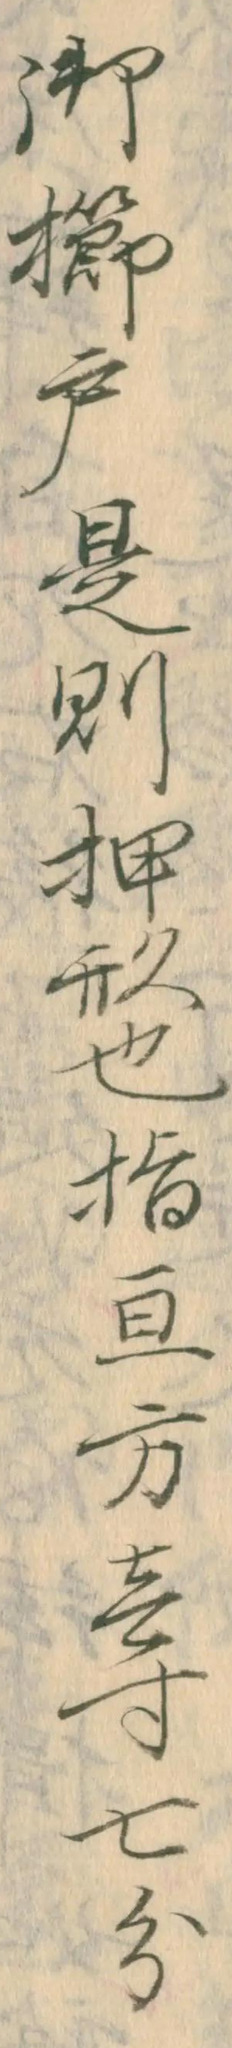御櫛戸是則押形也指亘方壱寸七分
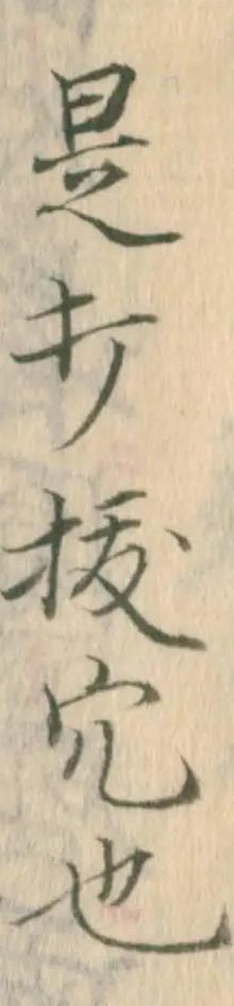是打抜穴也
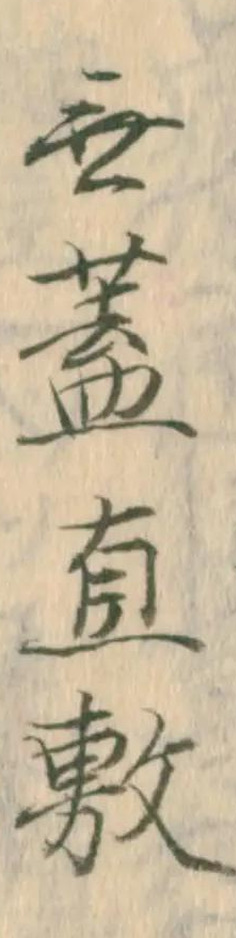無蓋直敷
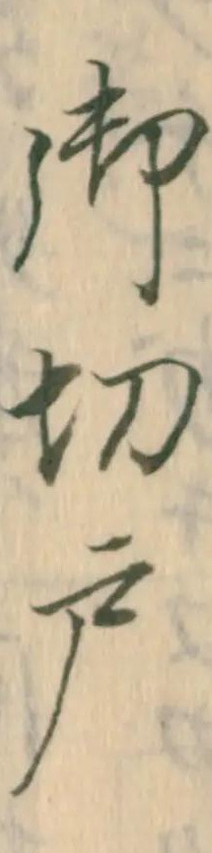御切戸
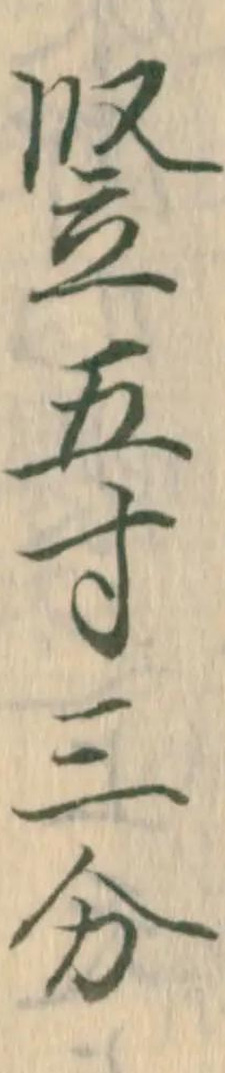竪五寸三分
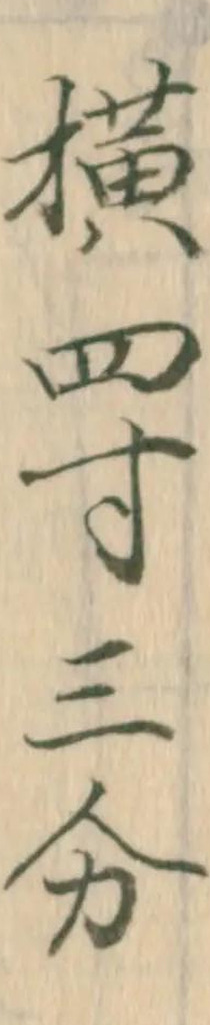横四寸三分
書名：賀茂社記録. 第15冊
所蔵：国立国会図書館 National Diet Library, JAPAN
